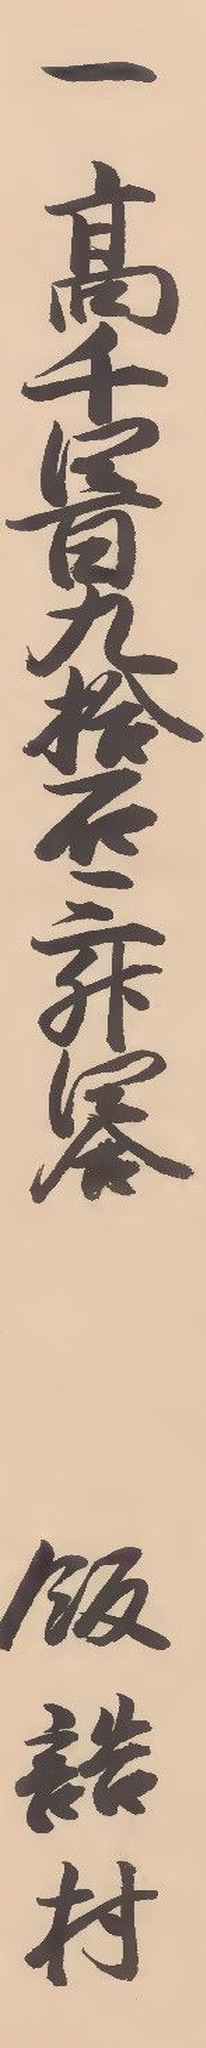一高千四百九拾石三升四合飯詰村
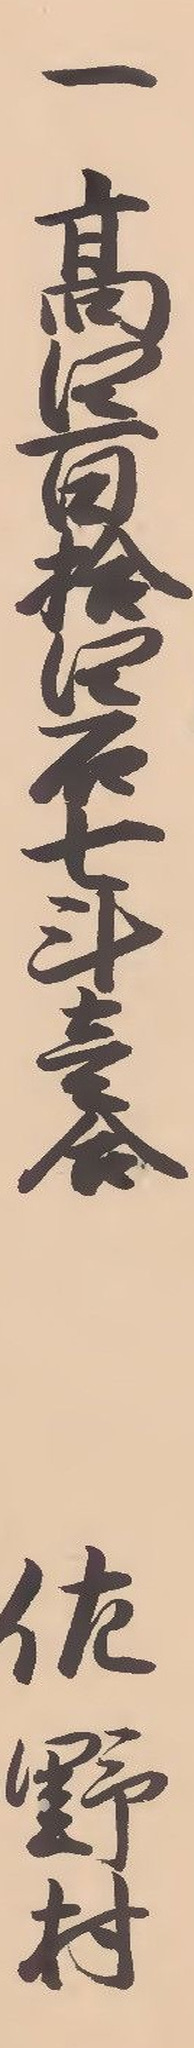一高四百拾四石七斗壱合佐野村
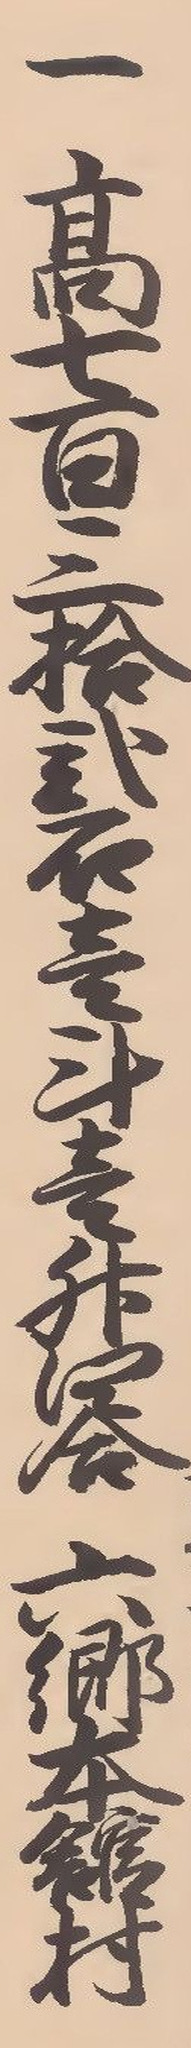一高七百三拾弐石壱斗壱升四合六郷本館村
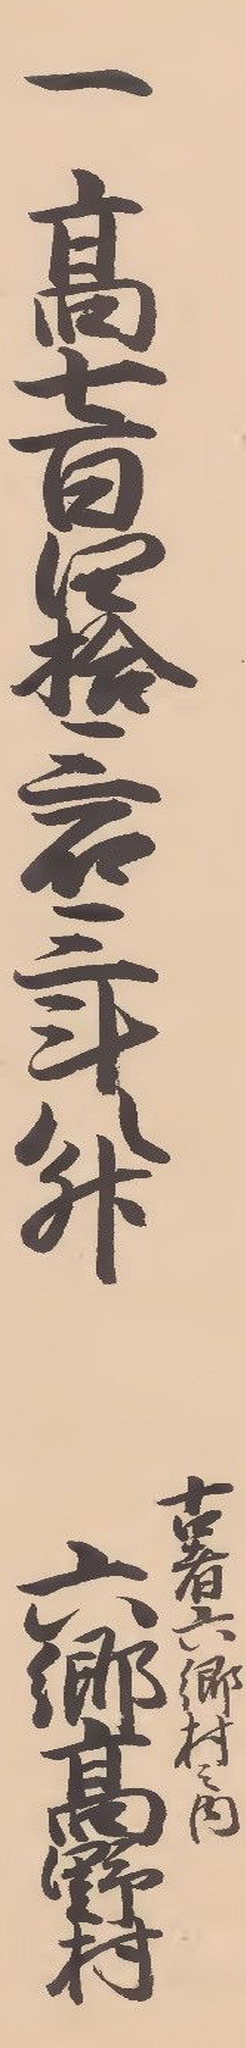一高七百四拾三石三斗八升六郷高野村
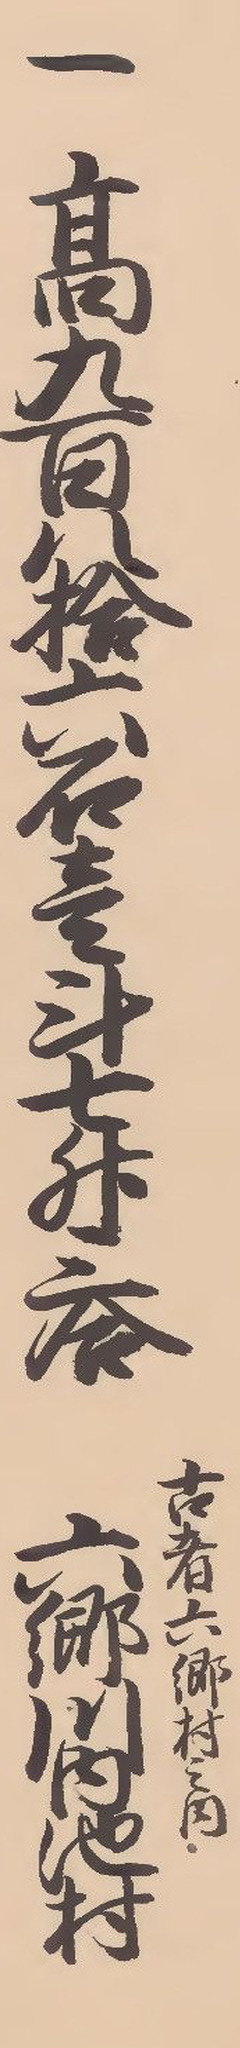一高九百八拾六石壱斗七升三合六郷河内池村
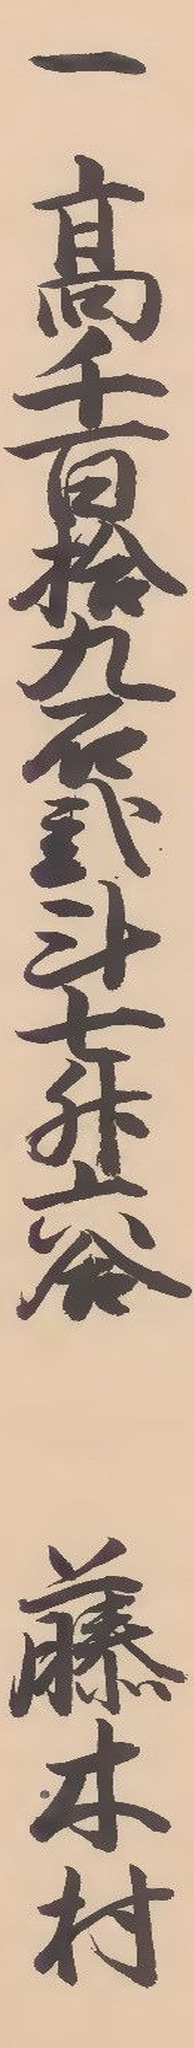一高千百拾九石弐斗七升六合藤木村

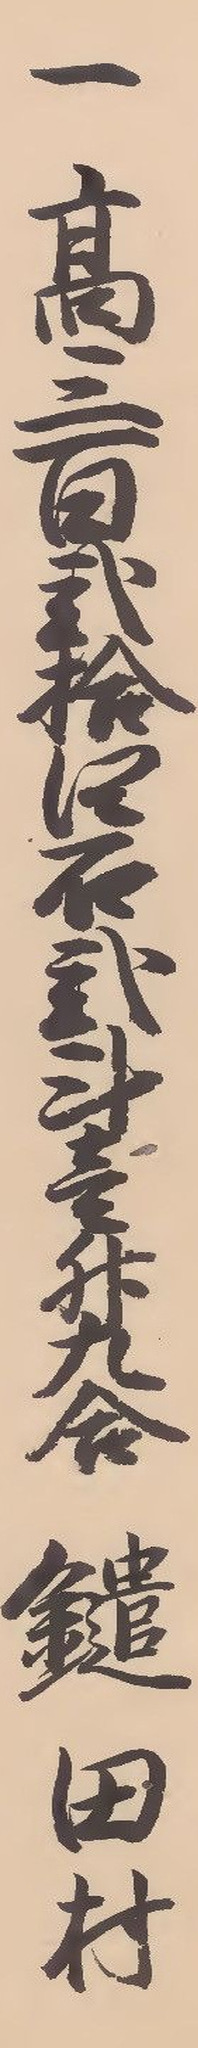一高三百弐拾四石弐斗壱升九合鑓田村
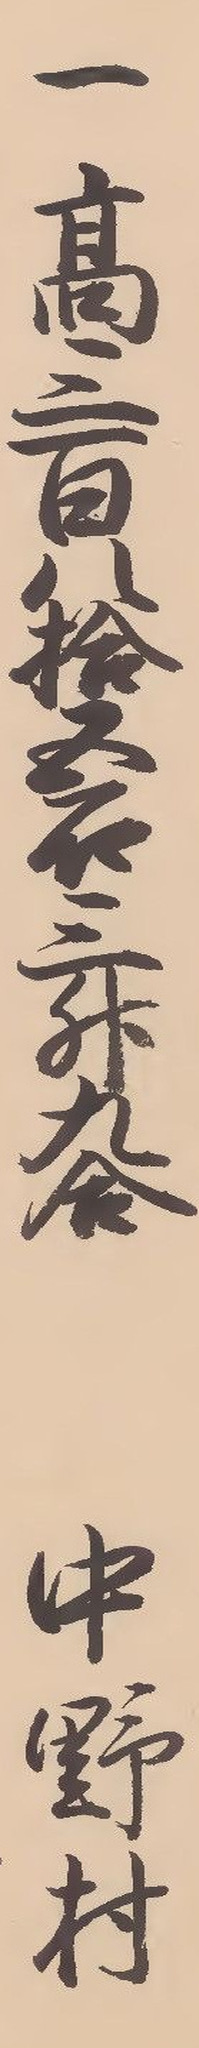一高三百八拾五石三升九合中野村
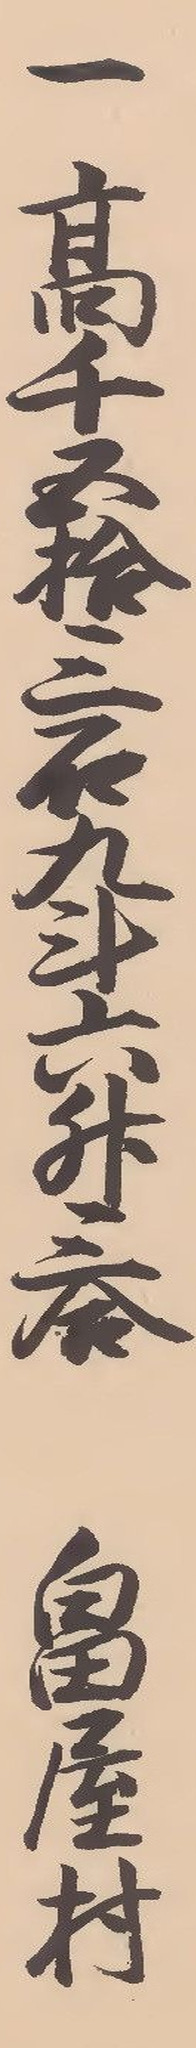一高千五拾三石九斗六升三合畠屋村
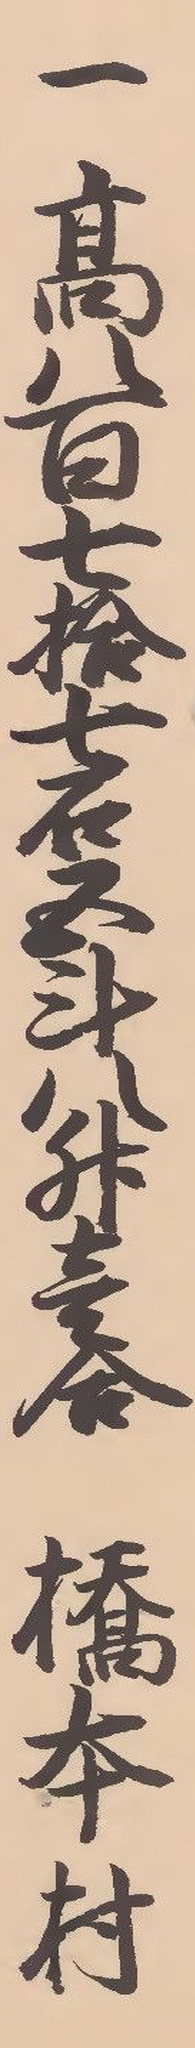一高八百七拾七石五斗八升壱合橋本村
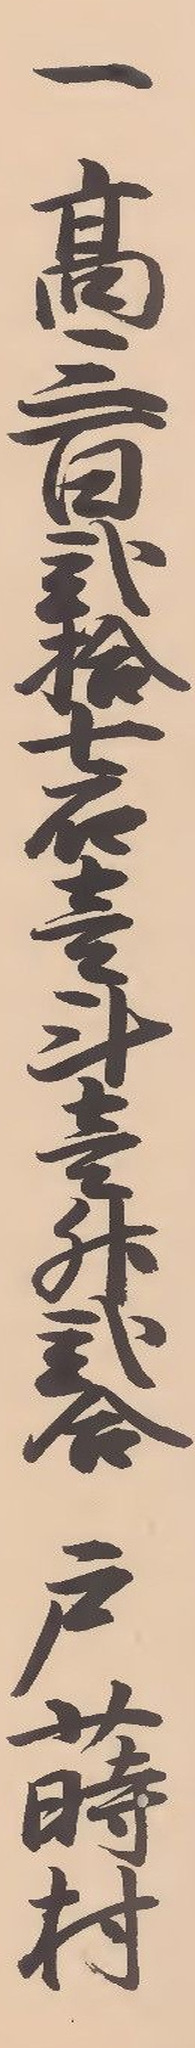一高三百弐拾七石壱斗壱升弐合戸蒔村
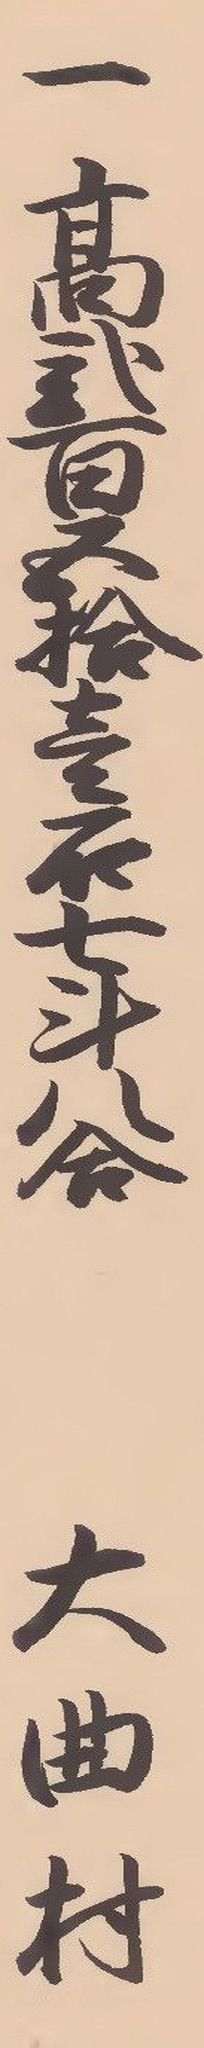一高弐百五拾壱石七斗八合大曲村
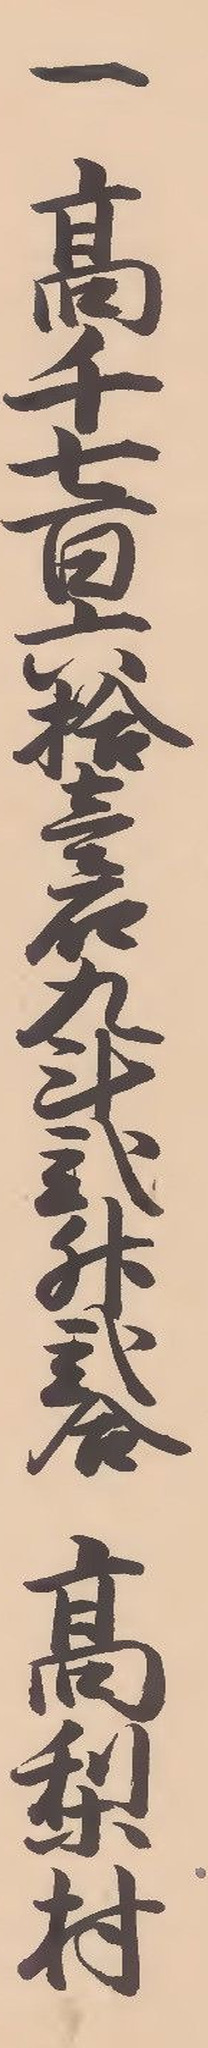一高千七百六拾壱石九斗弐升弐合高梨村
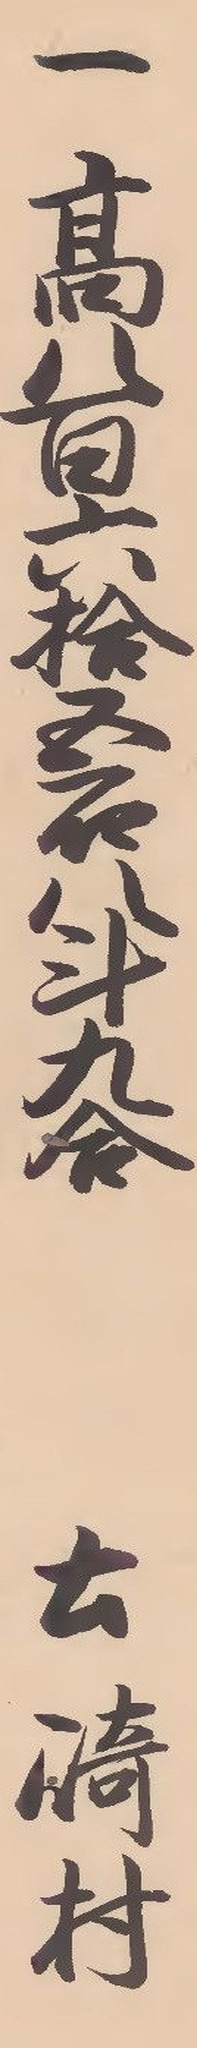一高八百六拾五石八斗九合土崎村

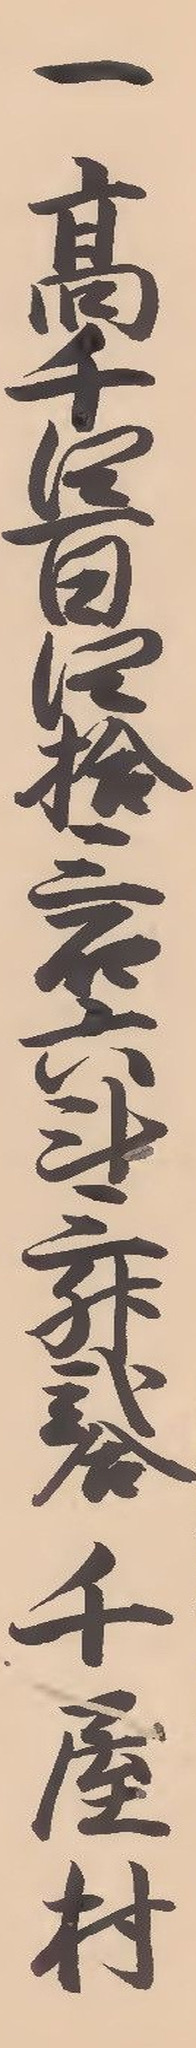一高千四百四拾三石六斗三升弐合千屋村
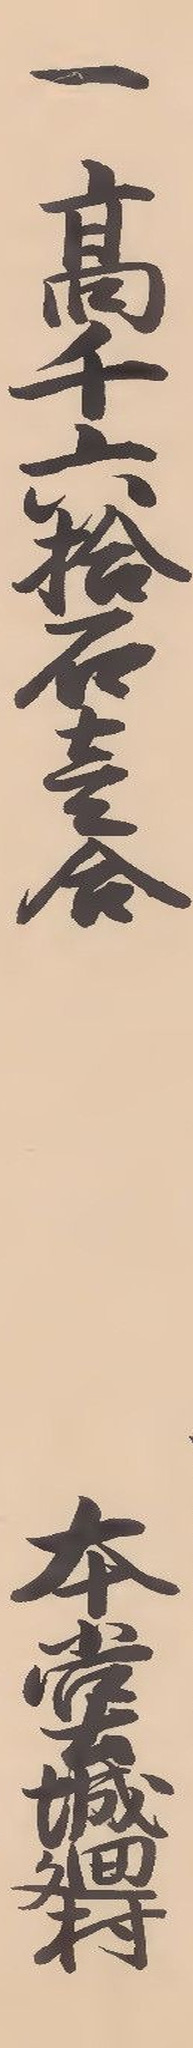一高千六拾石壱合本堂城廻村
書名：出羽国郷帳　５
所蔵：国立公文書館 National Archives of Japan
